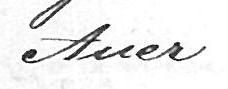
Auer
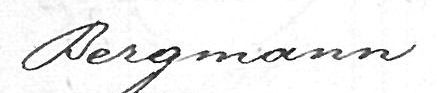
Bergmann
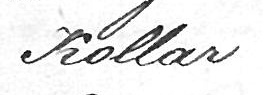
Kollar
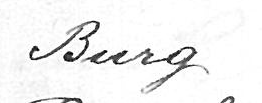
Burg
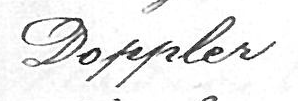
Doppler
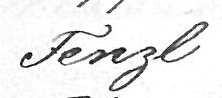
Fenzl
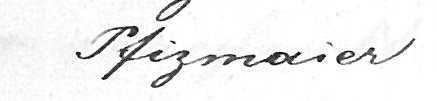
Pfizmaier
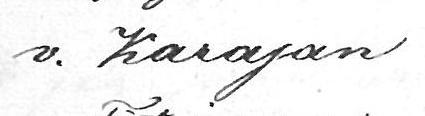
v. Karajan
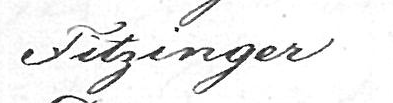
Fitzinger
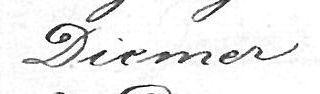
Diemer
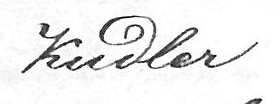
Kudler
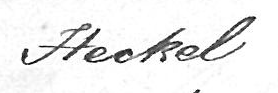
Heckel
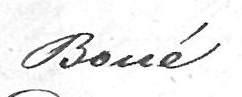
Boué
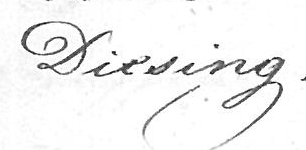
Diesing
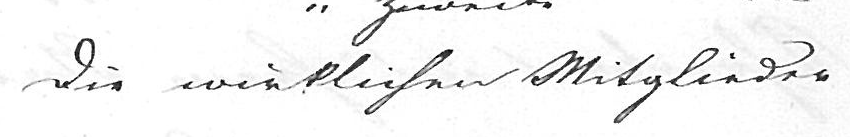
Die wirklichen Mitglieder
